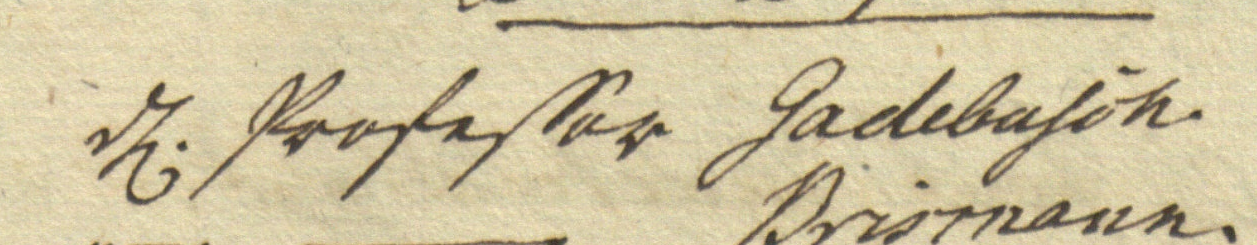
dh. Professor Gadebusch.
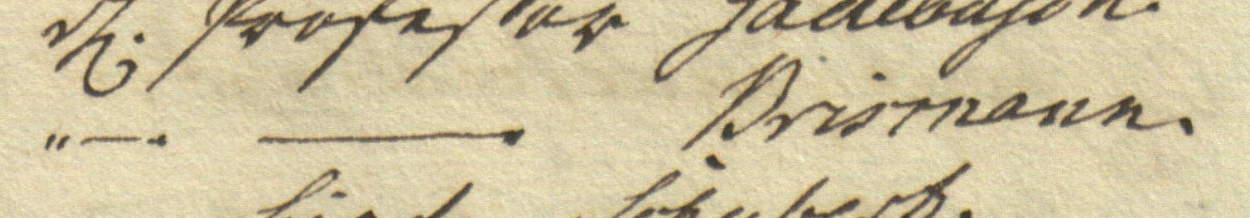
Brismann.
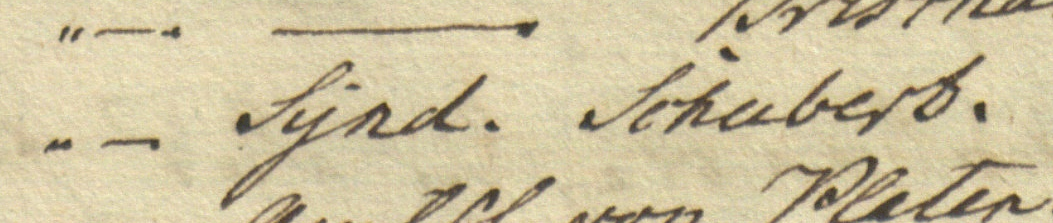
Sÿnd. Schubert.
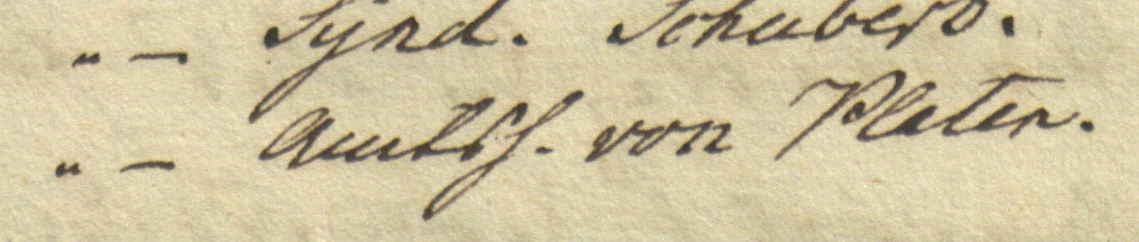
Amtsh. von Platen.
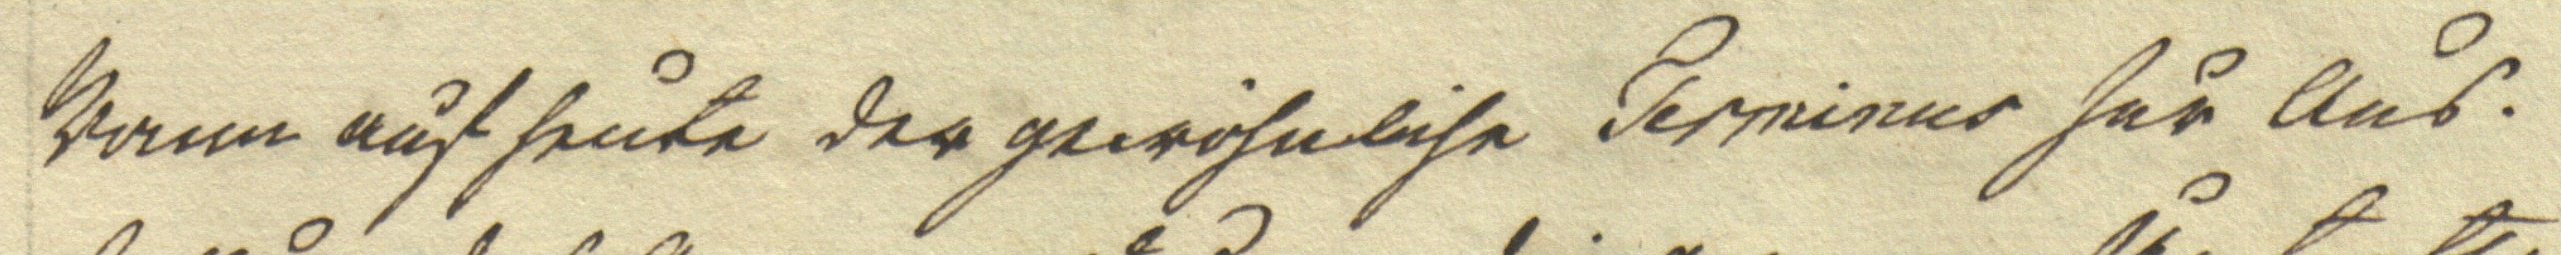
Wann auf heute der gewöhnliche Terminus zur Aus¬
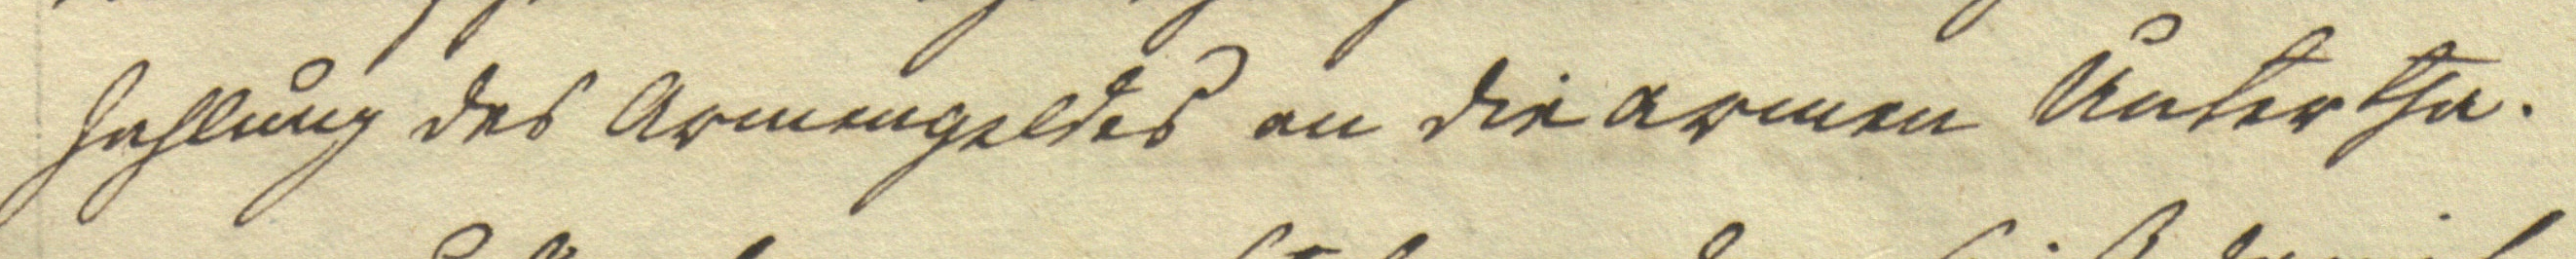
zahlung des Armengeldes an die armen Untertha¬
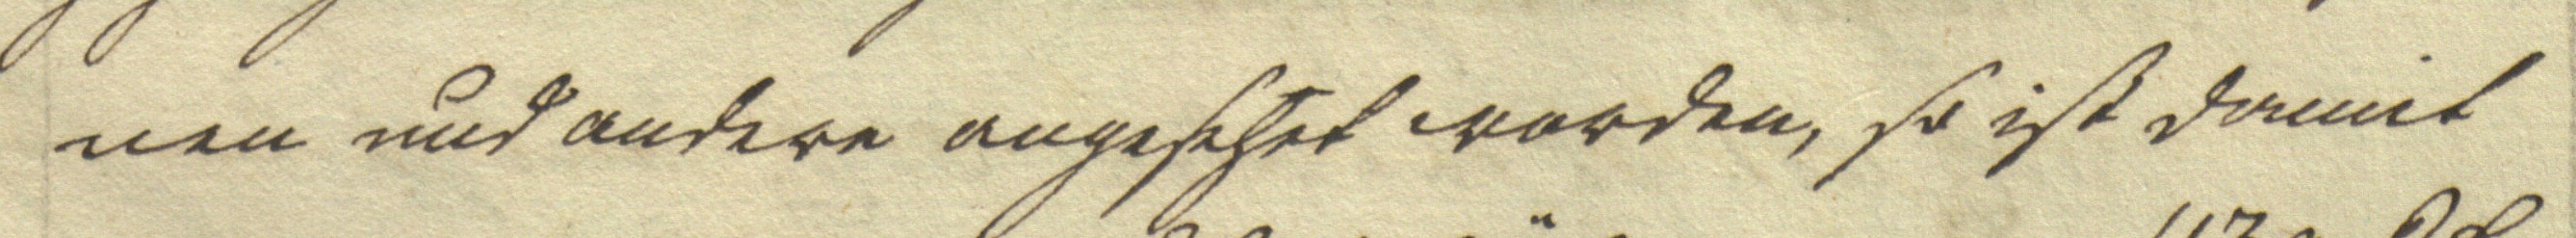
nen und andere angesetzet worden, so ist damit
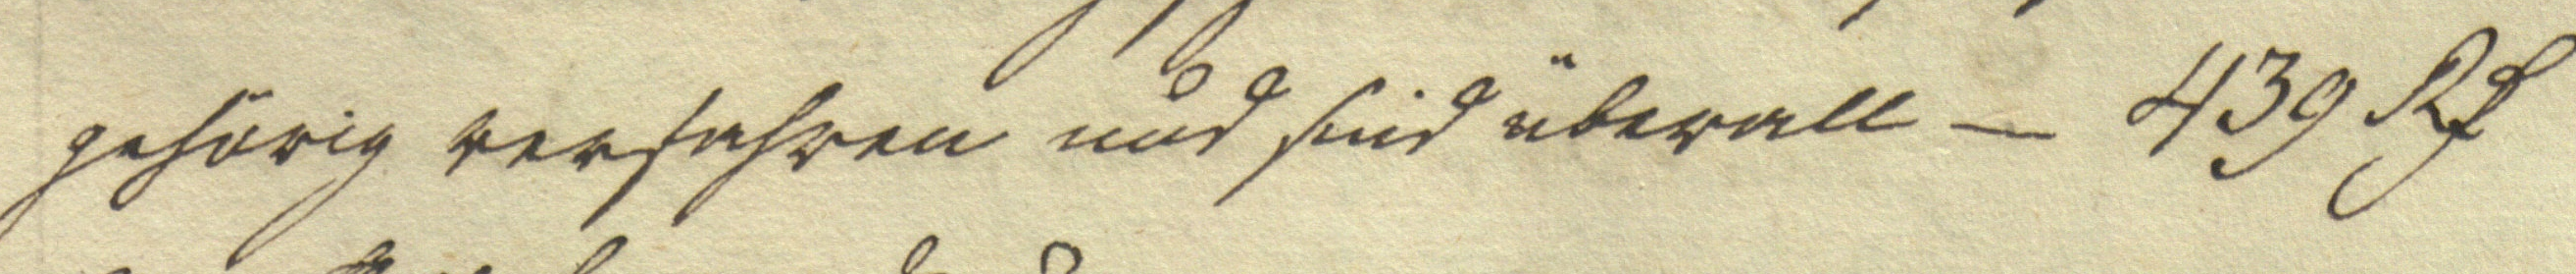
gehörig verfahren und sind überall 439 Rf
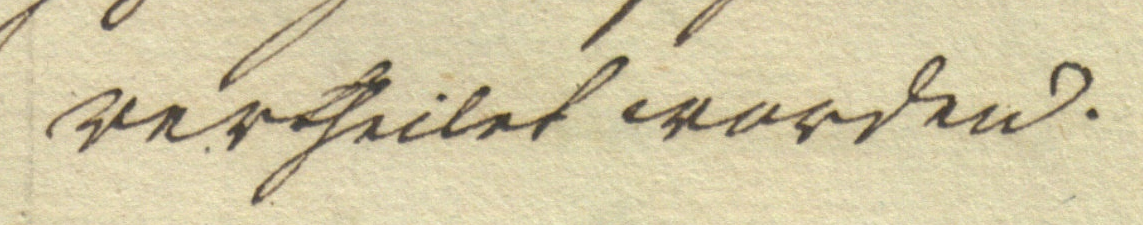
vertheilet worden.
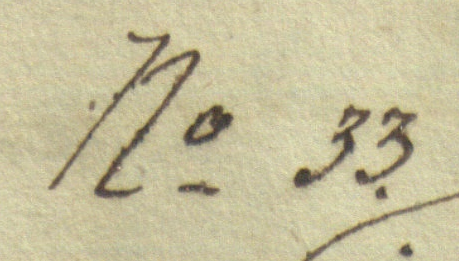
No 33.
